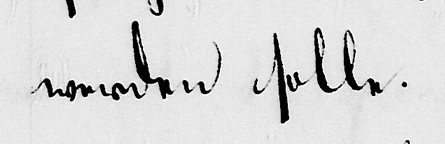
werden solle.
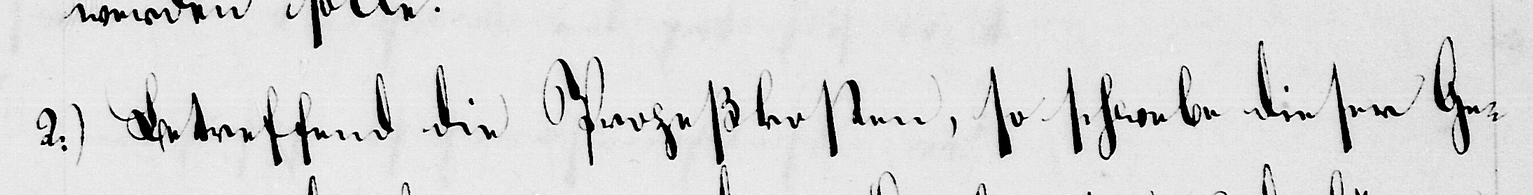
2.) Betreffend die Prozeßkosten, so schwebe dieser Ge¬
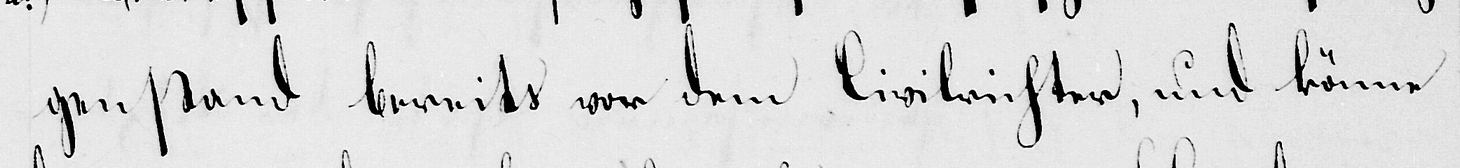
genstand bereits vor dem Civilrichter, und könne
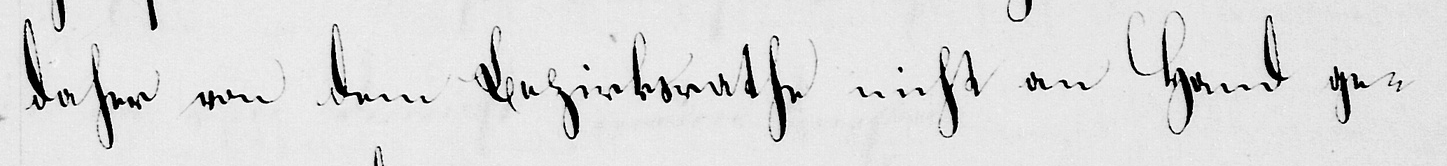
daher von dem Bezirksrathe nicht an Hand ge¬
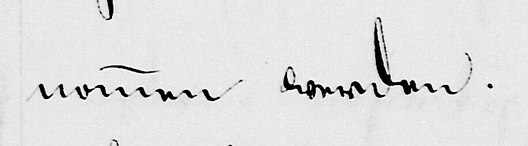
nommen werden.
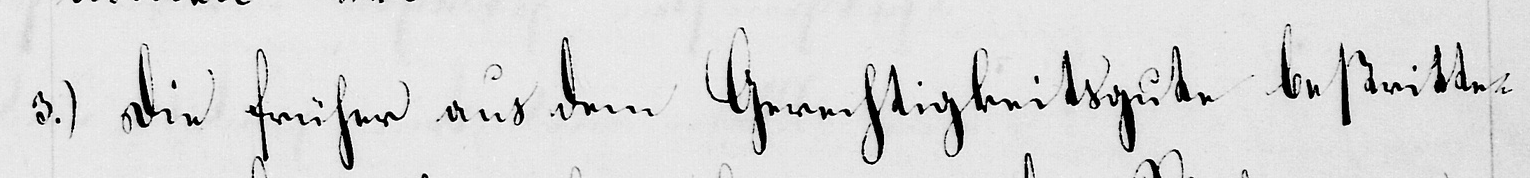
3.) Die früher aus dem Gerechtigkeitsgute bestritte¬
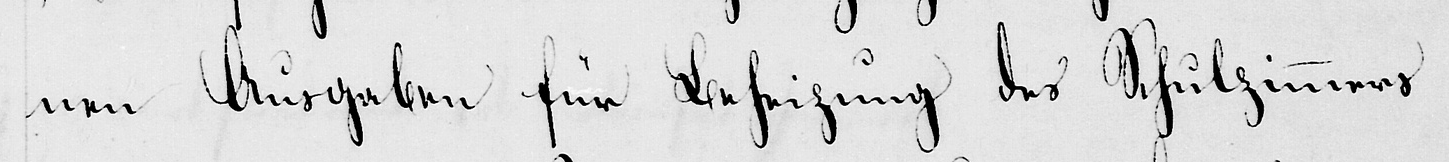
nen Ausgaben für Beheizung des Schulzimmers
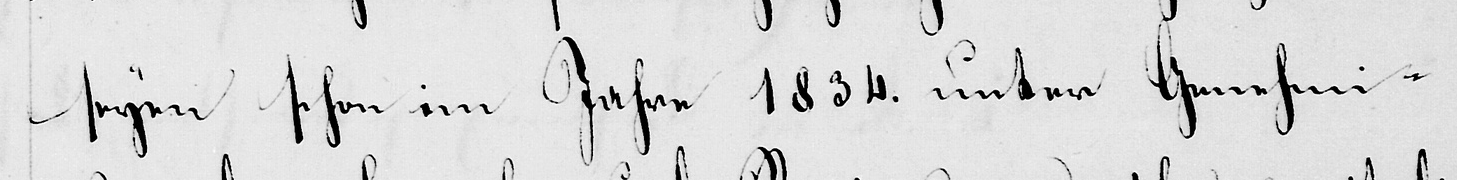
seyen schon im Jahre 1834. unter Genehmi¬
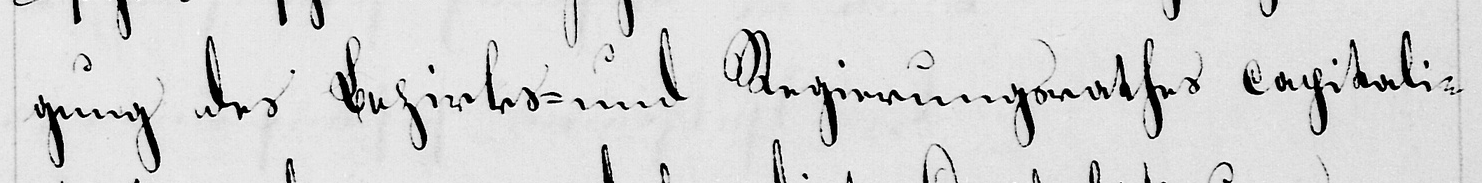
gung des Bezirks- und Regierungsrathes capitali¬
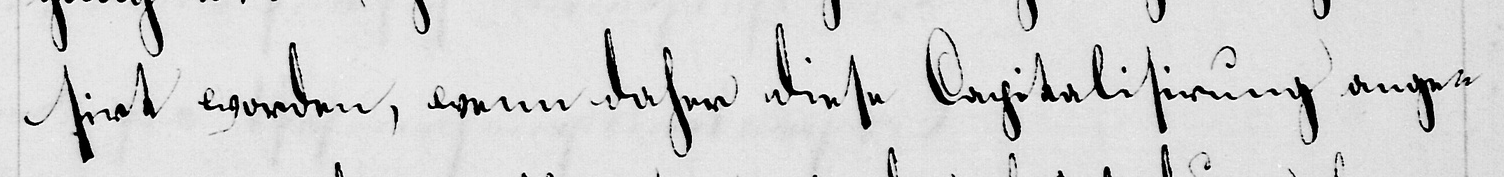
sirt worden, wenn daher diese Capitalisirung ange¬
